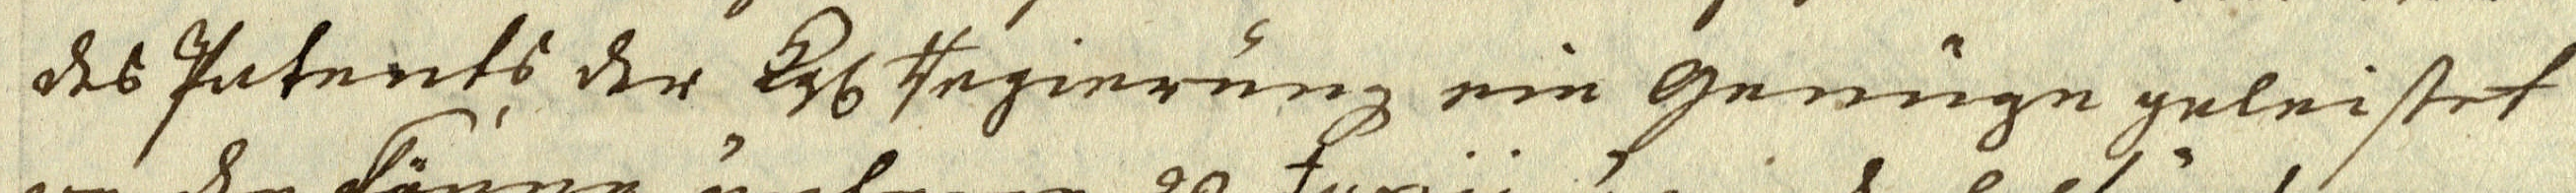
des Patents der Kgl. Regierung ein Genüge geleistet
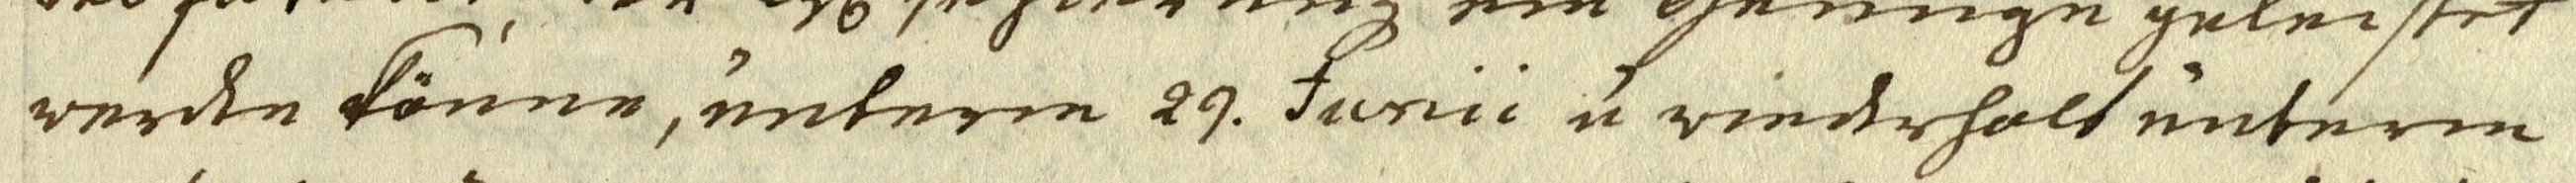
werden könne, unterm 29. Junii u wiederholt unterm
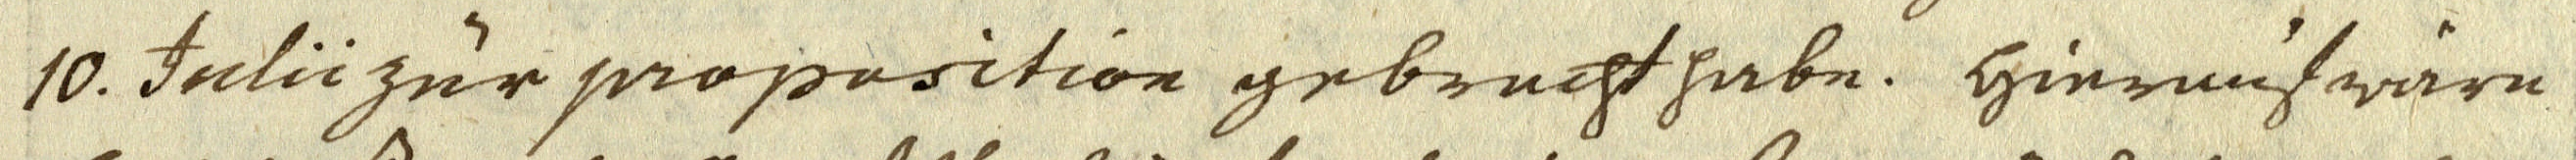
10. Julii zur proposition gebracht habe. Hierauf wäre
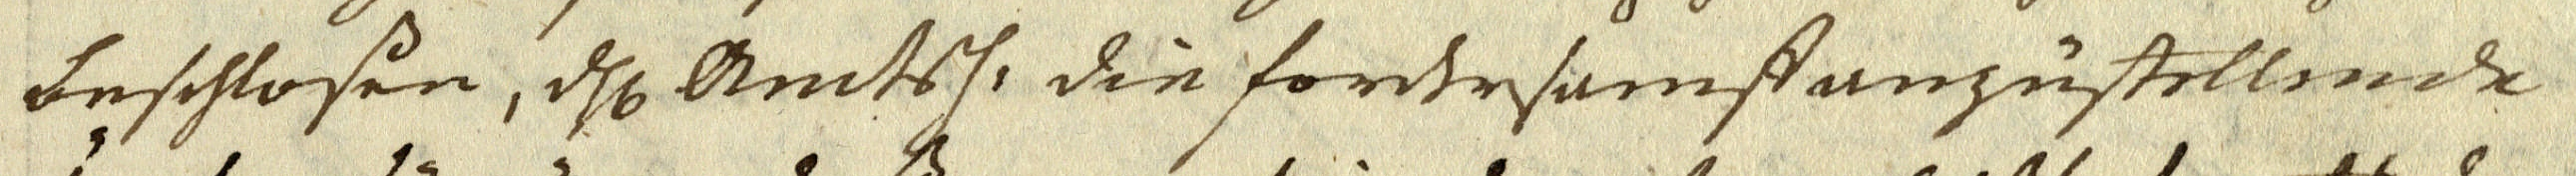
beschloßen, dh. Amtsh. die fordersamst anzustellende
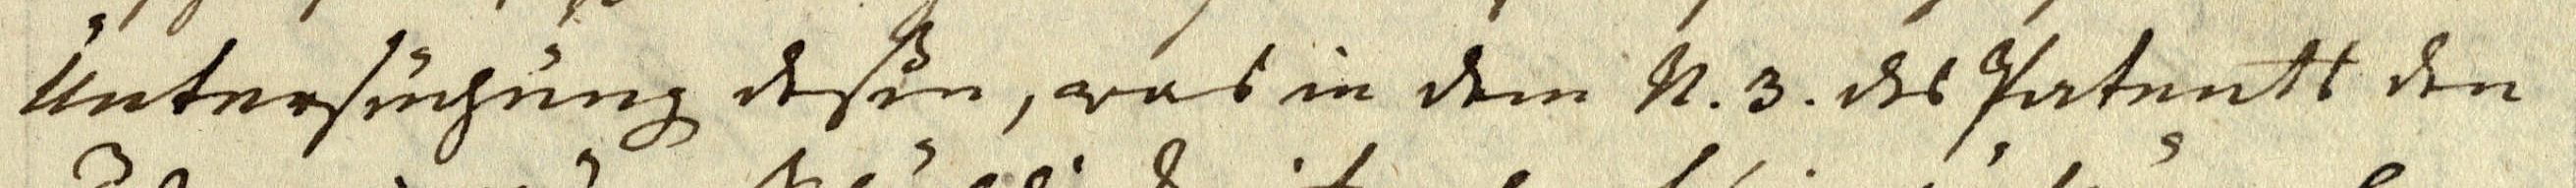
Untersuchung deßen, was in dem N. 3 des Patents den
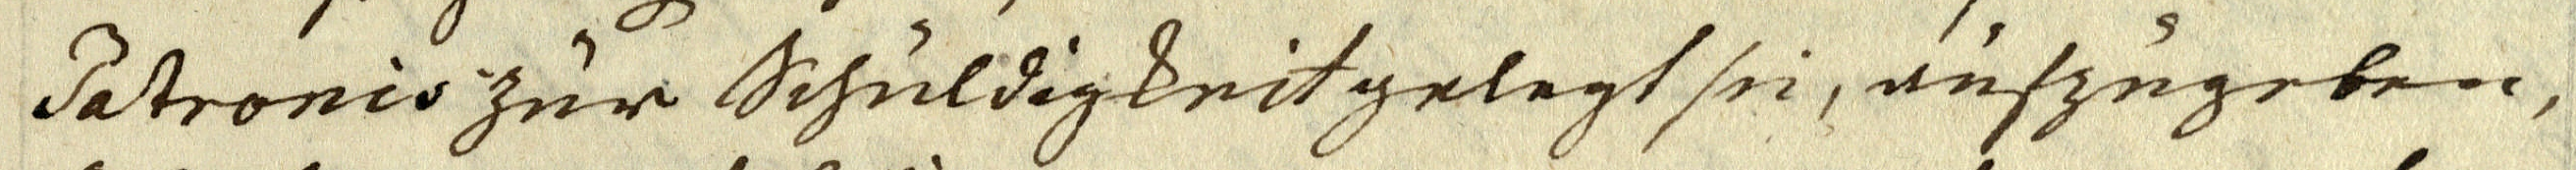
Patronis zur Schuldigkeit gelegt sei, aufzugeben,
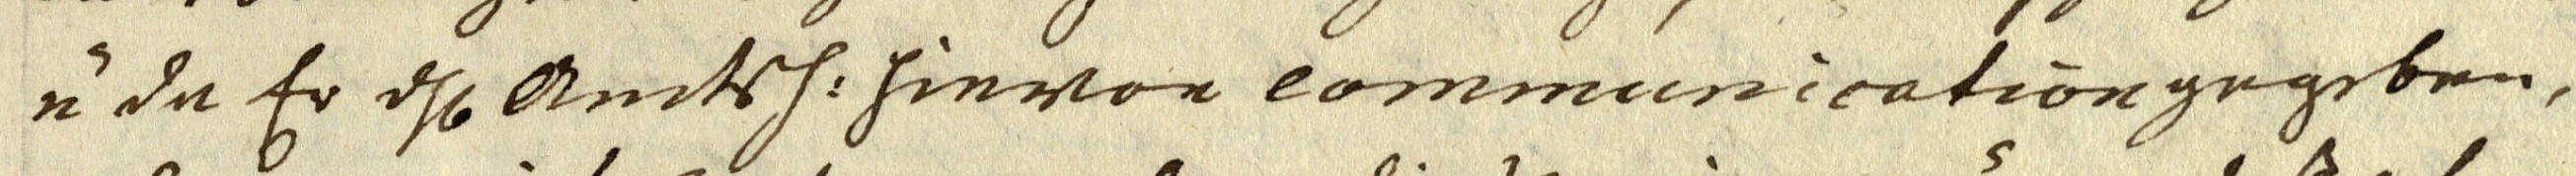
u da Er dh. Amtsh. hievon communication gegeben,
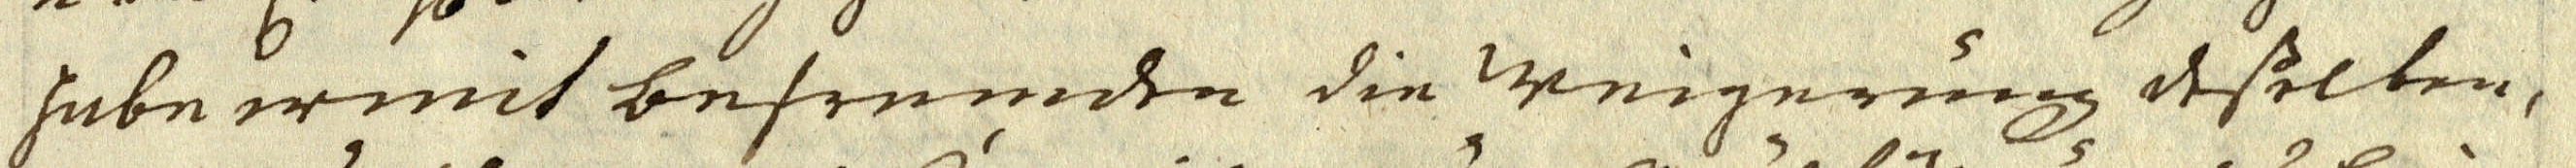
habe ermit Befremden die Weigerung deßelben,
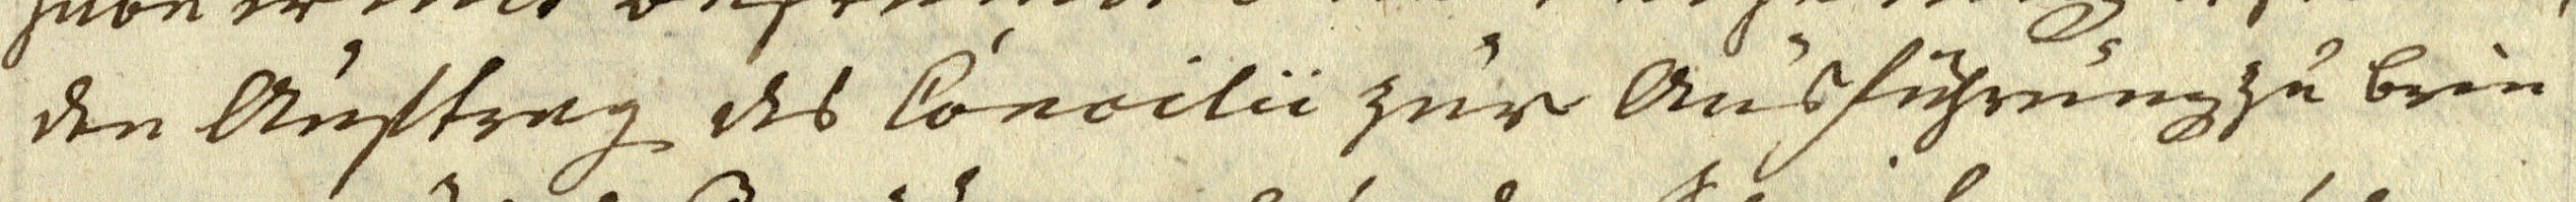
den Auftrag des Concilii zur Ausführung zu brin¬
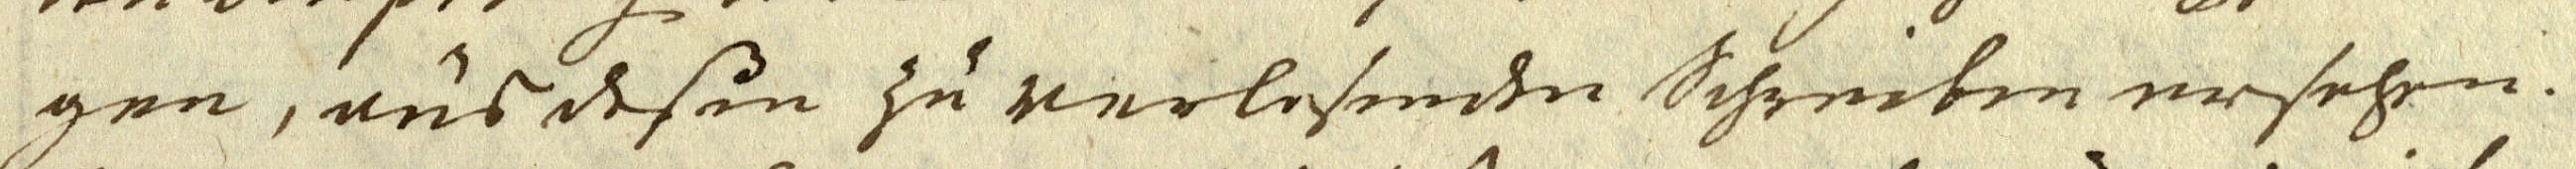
gen aus deßen zu verlesenden Schreiben ersehen.
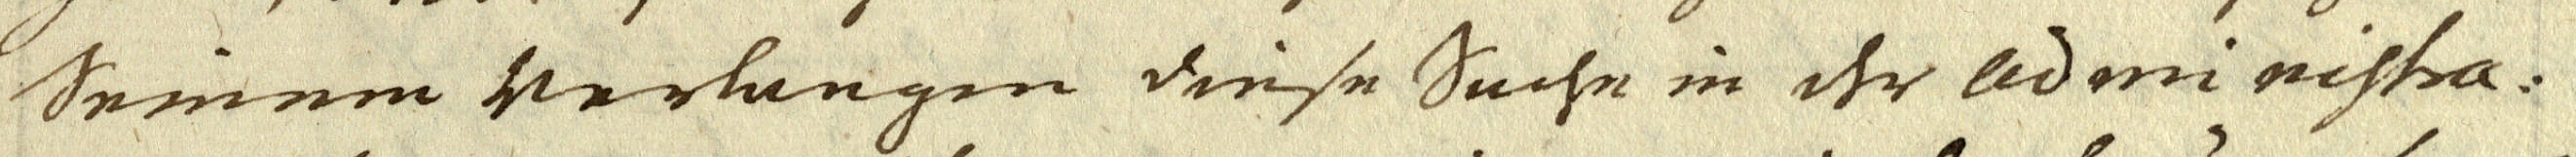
Seinem Verlangen diese Sache in der Administra¬
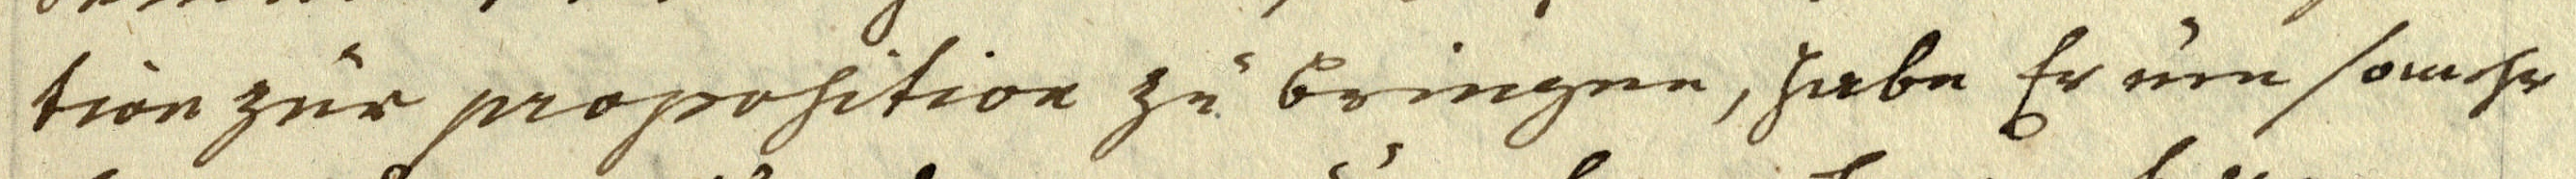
tion zur proposition zu bringen, habe Er um somehr
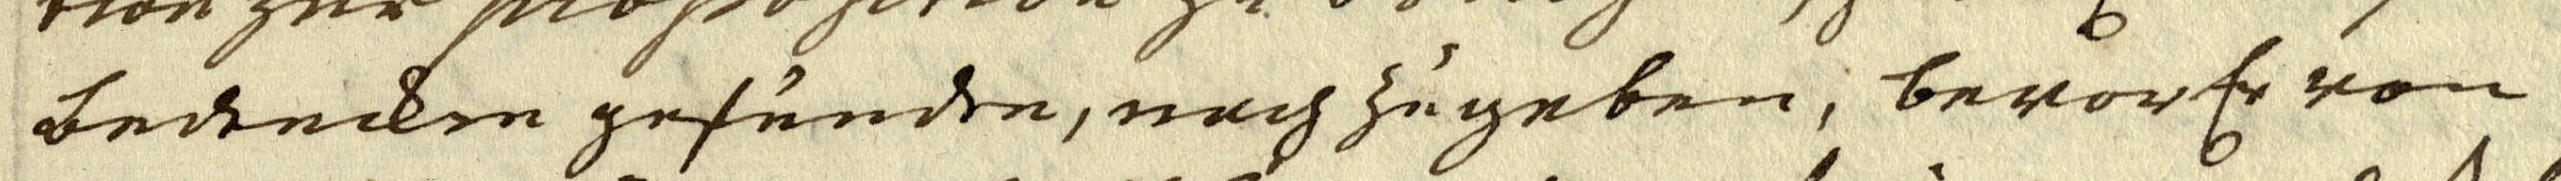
Bedencken gefunden, nach zu geben, bevor Er von
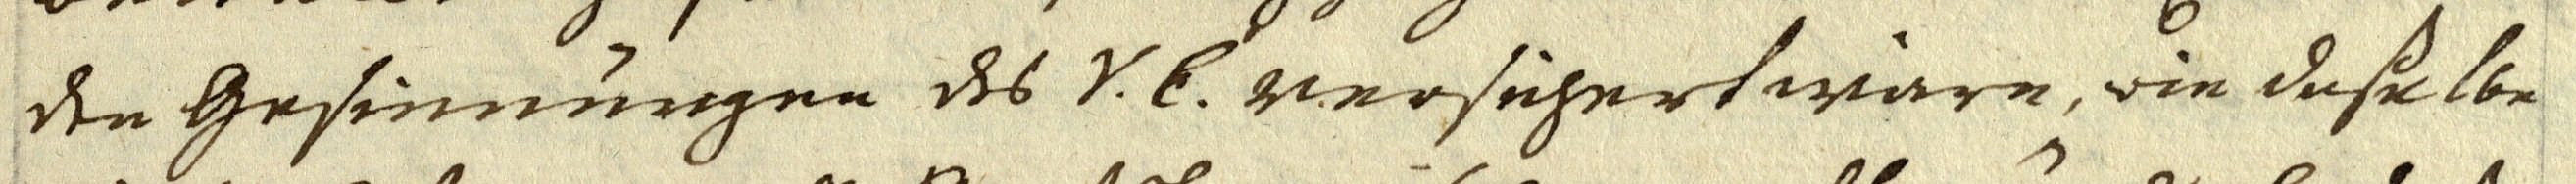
den Gesinnungen des V. C. versichert wäre, wie daßelbe
